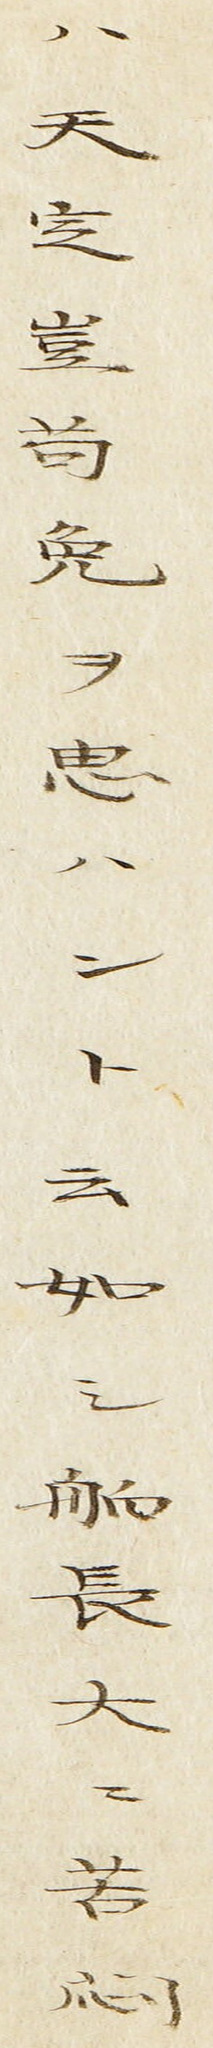ハ天定豈苟免ヲ思ハント云如シ舶長大ニ苦悶
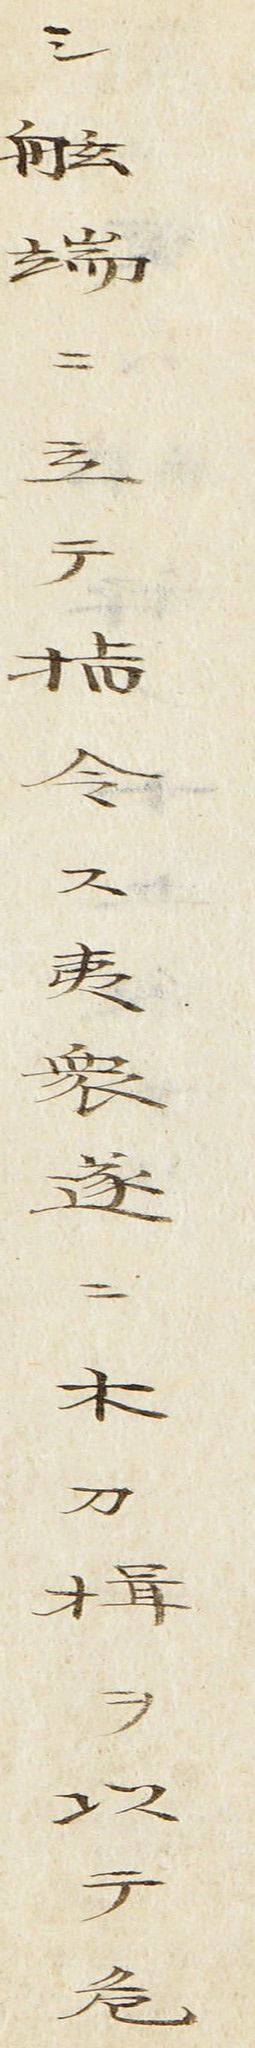シ舷端ニ立テ指令ス夷衆遂ニ木刀楫ヲ以テ危
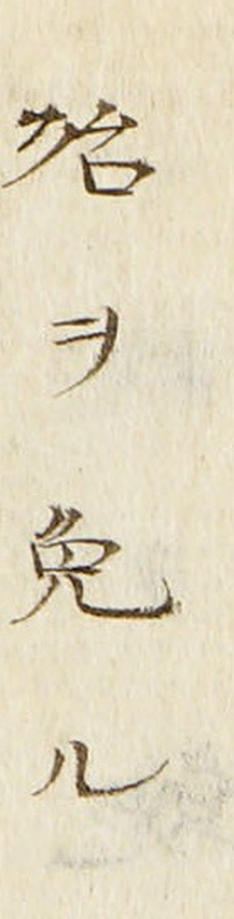殆ヲ免ル
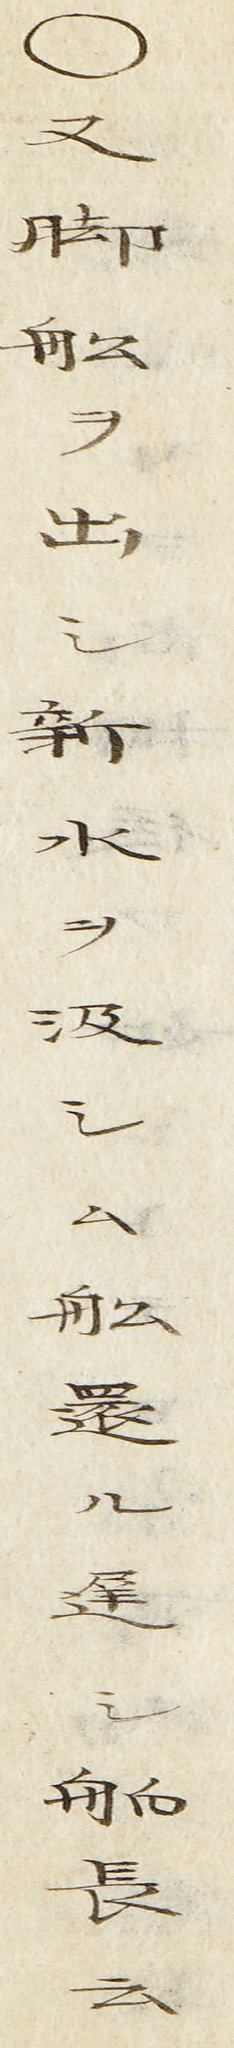〇又脚舩ヲ出シ新水ヲ汲シム舩還ル遅シ舶長云
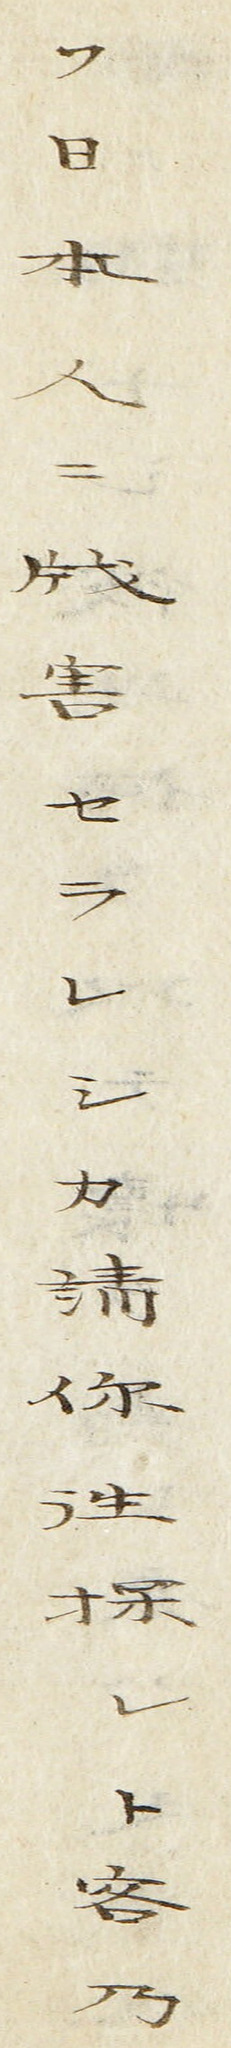フ日本人ニ戕害セラレシカ請你往探レト客乃
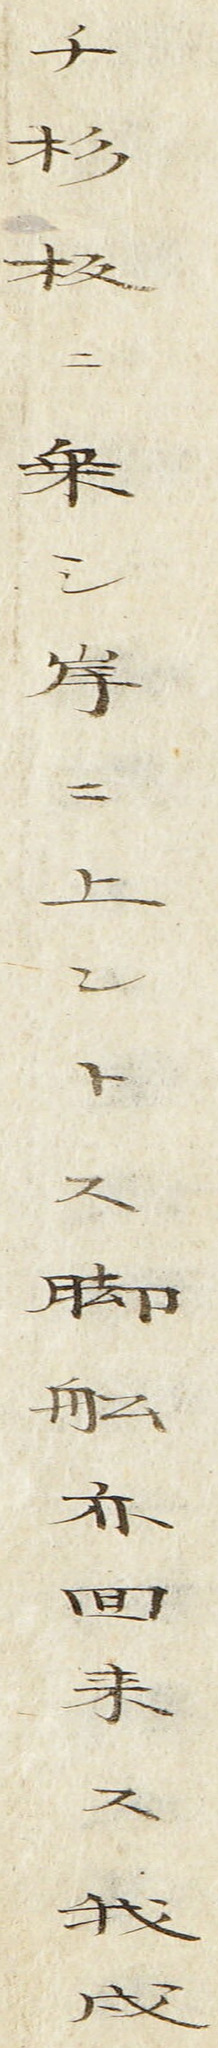チ杉板ニ乗シ岸ニ上ントス脚舩亦回来ス我戍
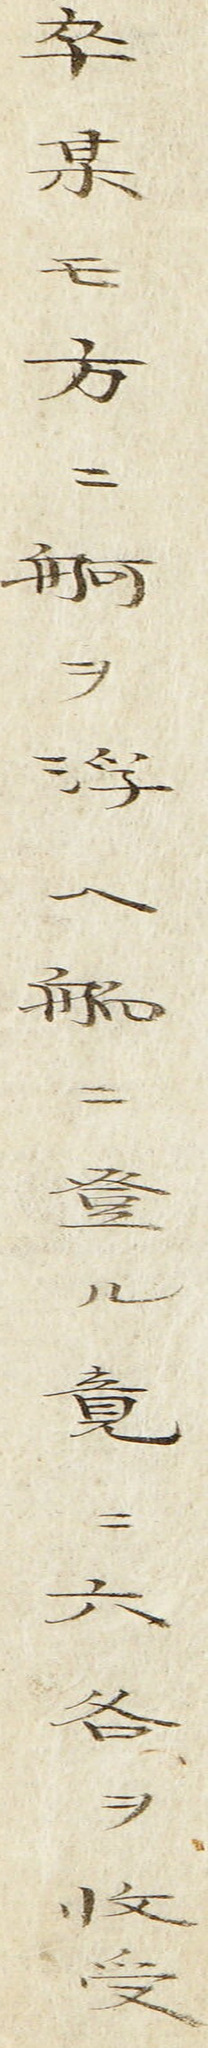卒某モ方ニ舸ヲ浮ヘ舶ニ登ル竟ニ六各ヲ収受

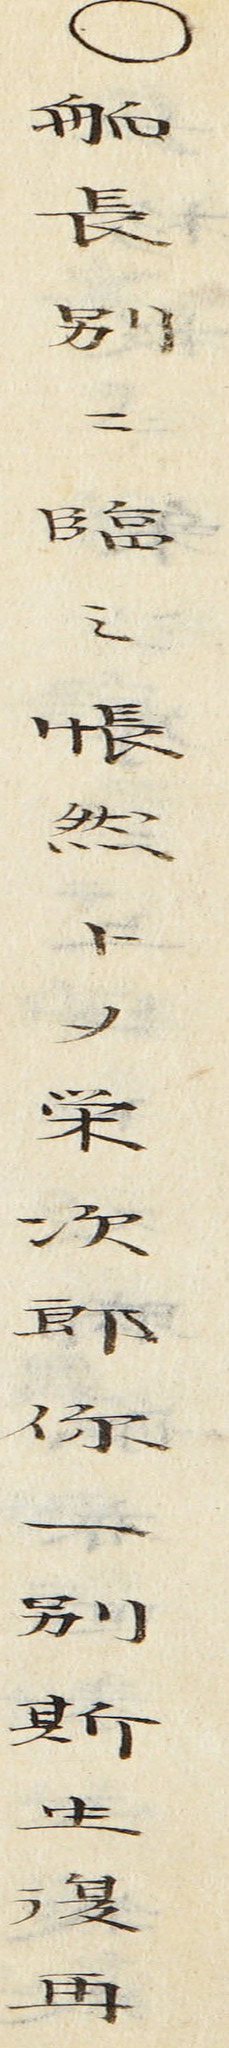〇舶長別ニ臨ミ悵然トシテ栄次郎你一別斯生復再
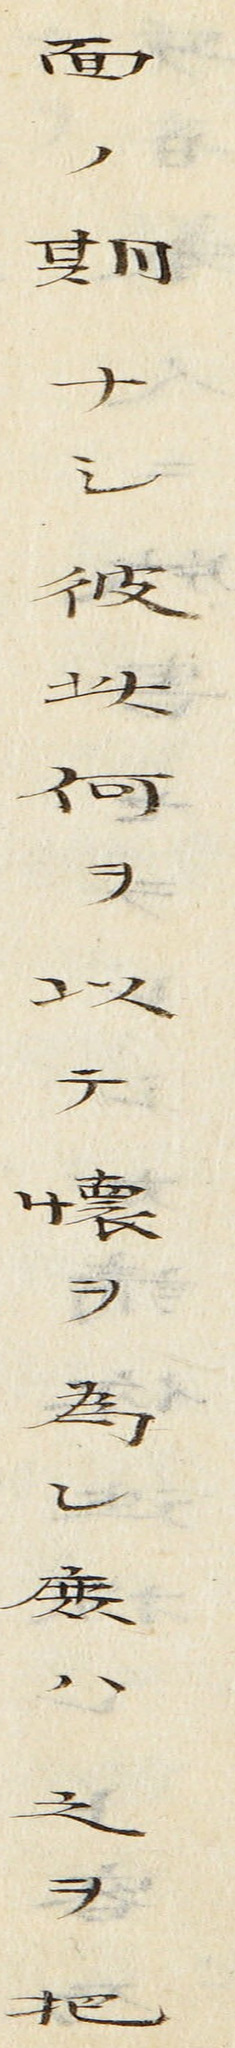面ノ期ナシ彼此何ヲ以テ懐ヲ為シ庶ハ之ヲ把
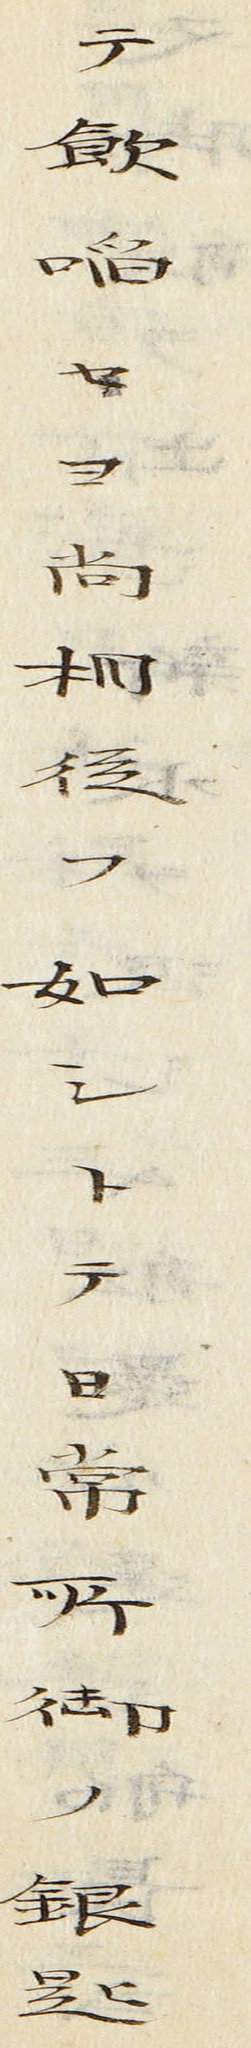テ飲㗖？セヨ尚相従フ如シトテ日常所御ノ銀匙
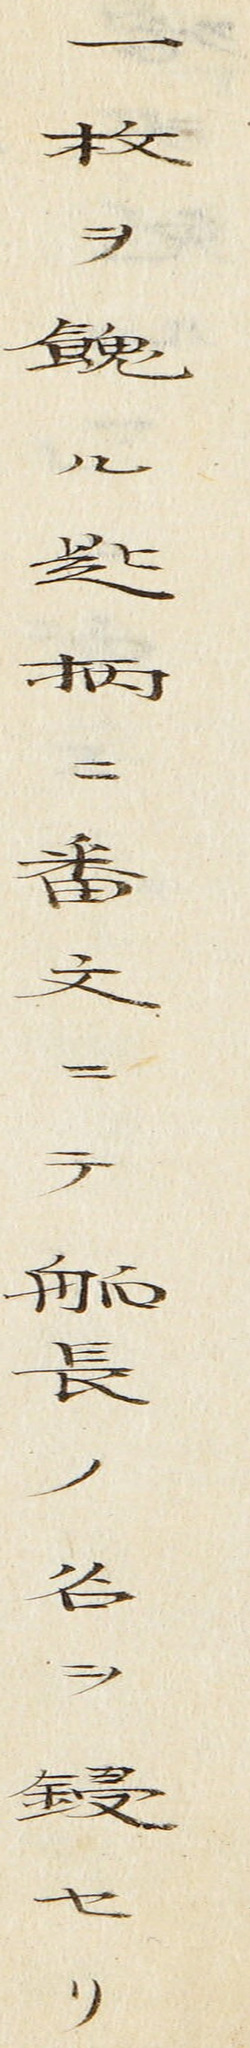一枚ヲ餽ル匙柄ニ番文ニテ舶長ノ名ヲ鋟セリ
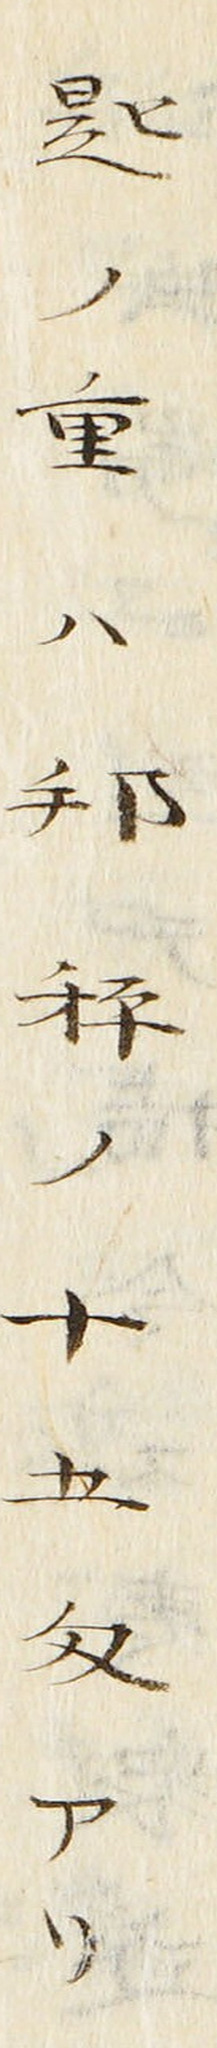匙ノ重ハ邦秤ノ十五匁アリ

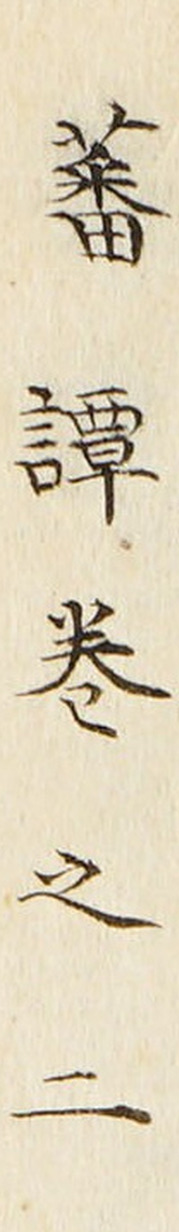蕃談巻之二

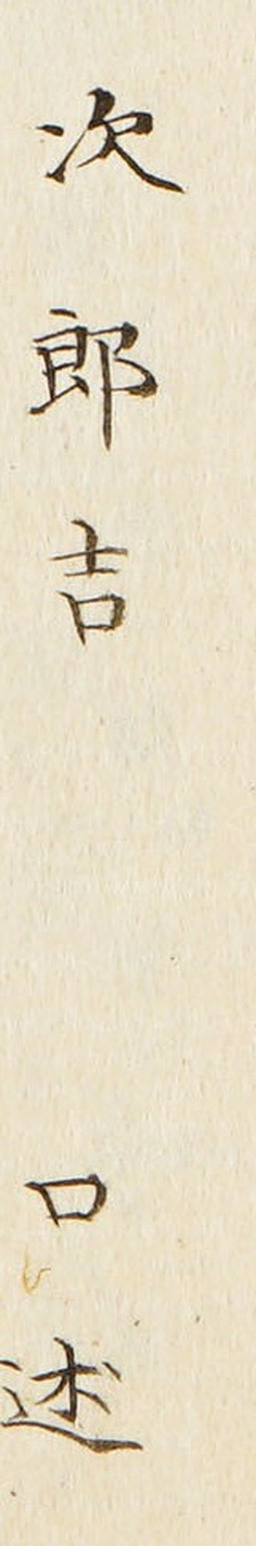次郎吉口述
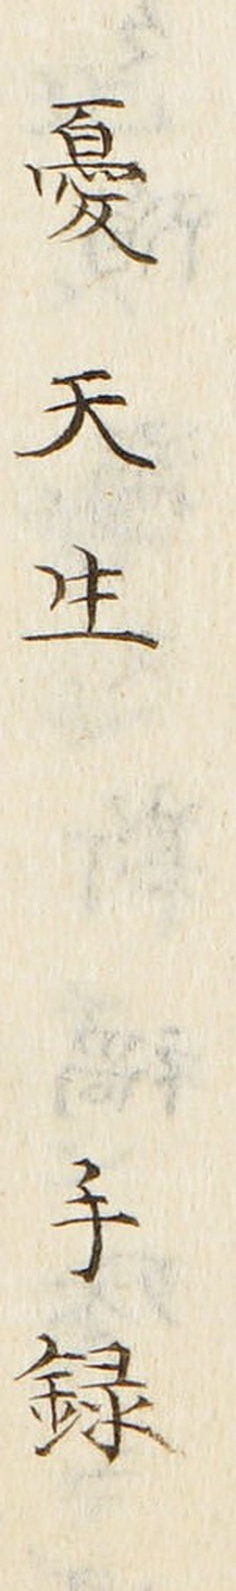憂天生手録
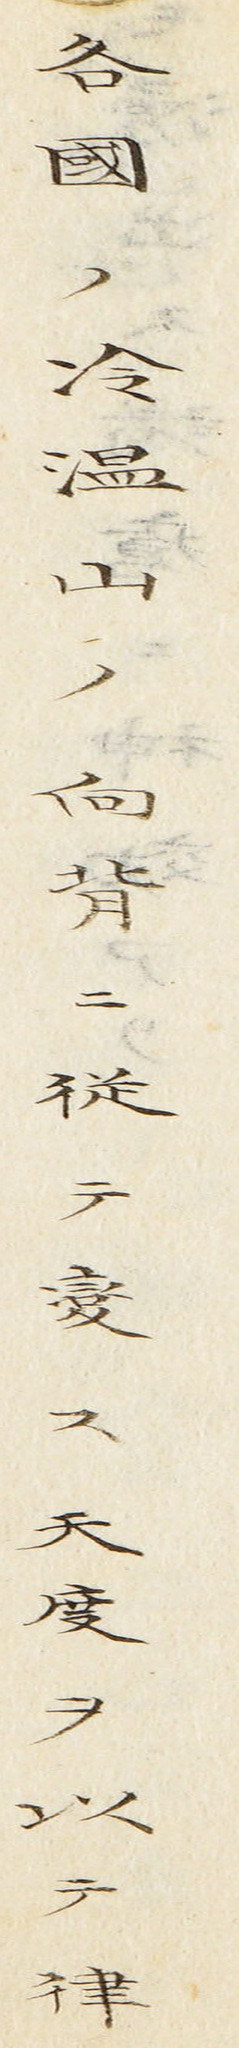〇各国ノ冷温山ノ向背ニ従テ変ス天度ヲ以テ律
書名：蕃談
